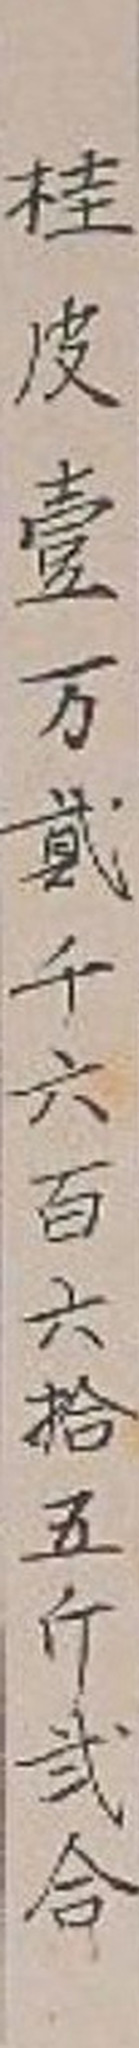桂皮壹万貳千六百六拾五斤弐合
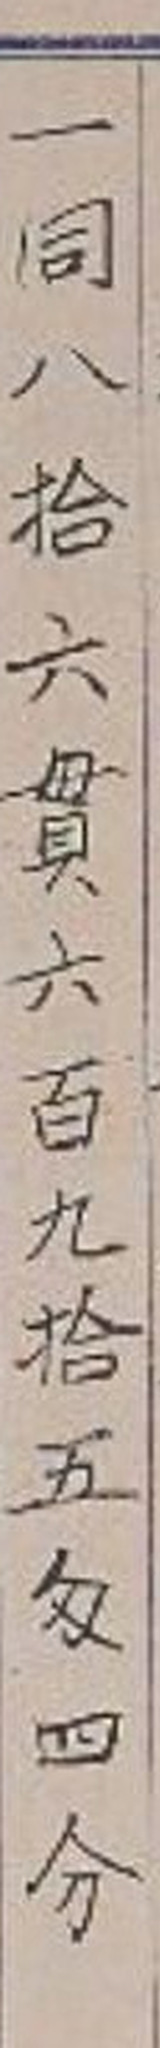一同八拾六貫六百九拾五匁四分
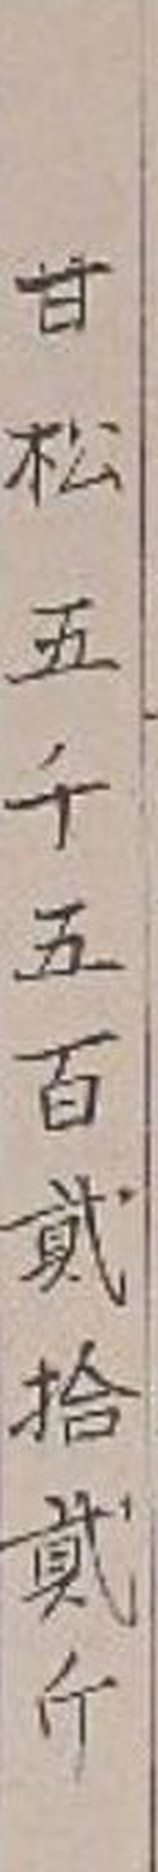甘松五千五百貳拾貳斤
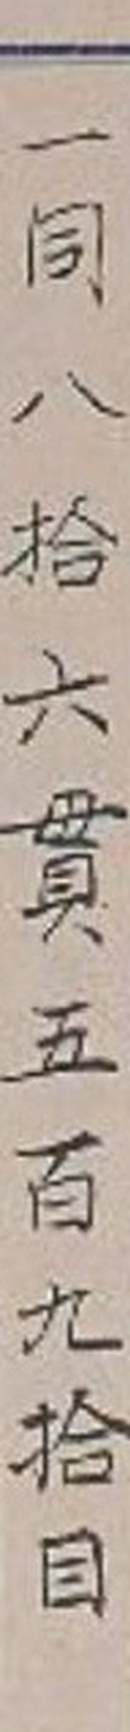一同八拾六貫五百九拾目
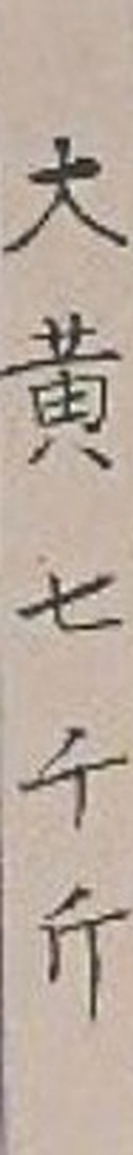大黄七千斤
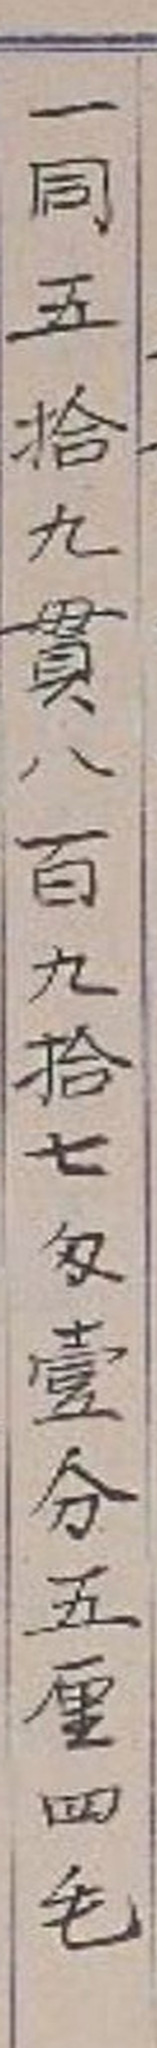一同五拾九貫八百九拾七匁壹文五厘四毛
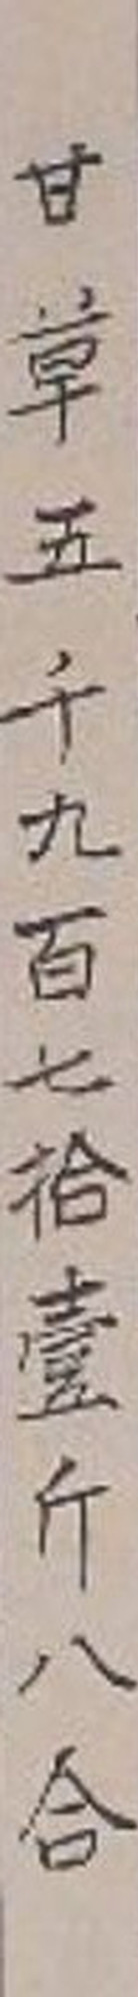甘草五千九百七拾壹斤八合
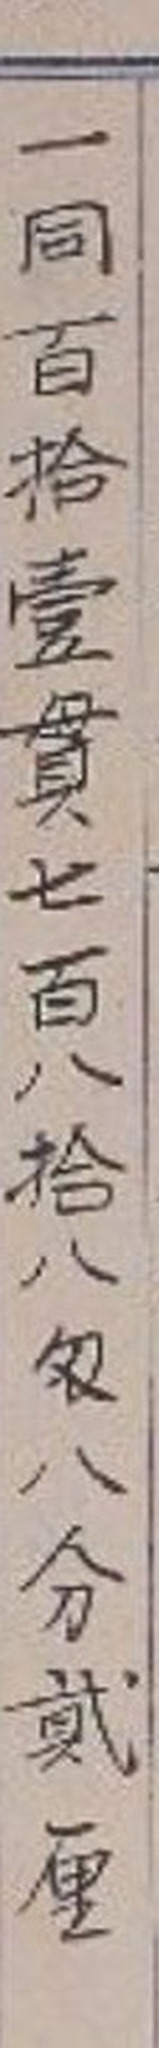一同百拾壹貫七百八拾八匁七分貳厘
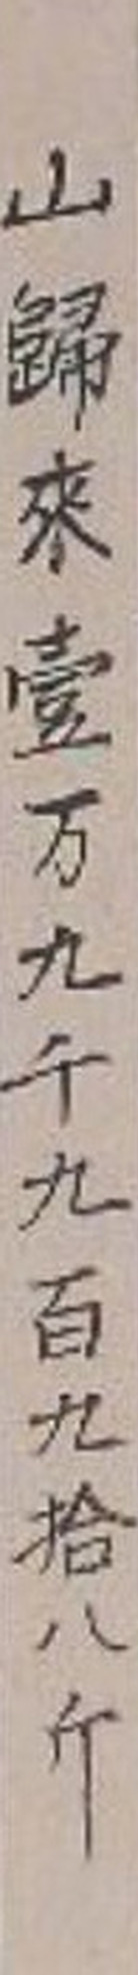山歸來壹万九千九百九拾八斤

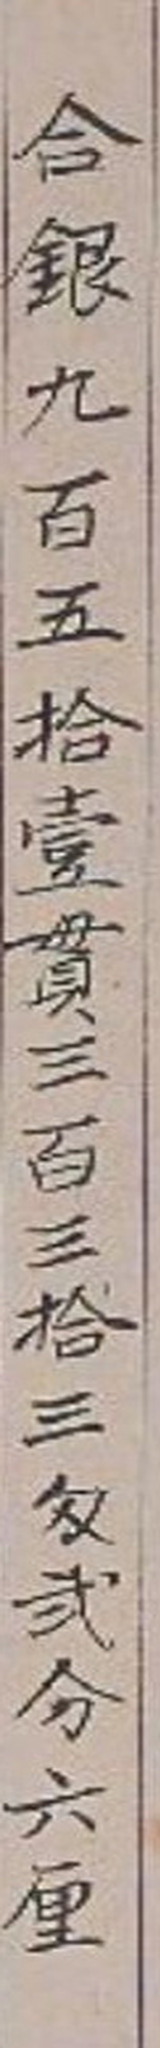合銀九百五拾壹貫三百三拾三匁弐分六厘
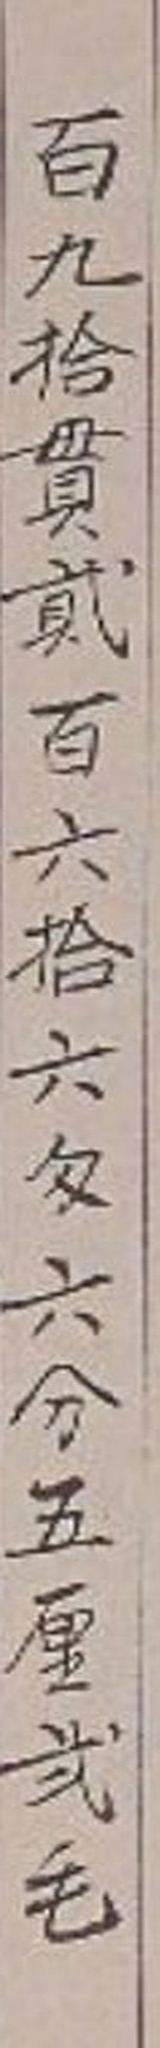百九拾貫貮百六拾六匁六分五厘弐毛
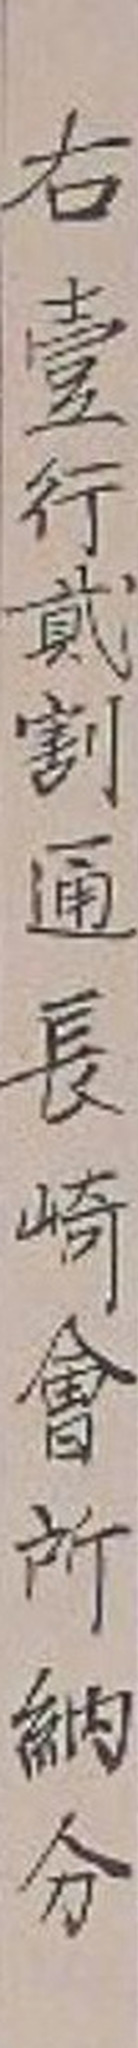右壹行貮割通長崎㑹所納分
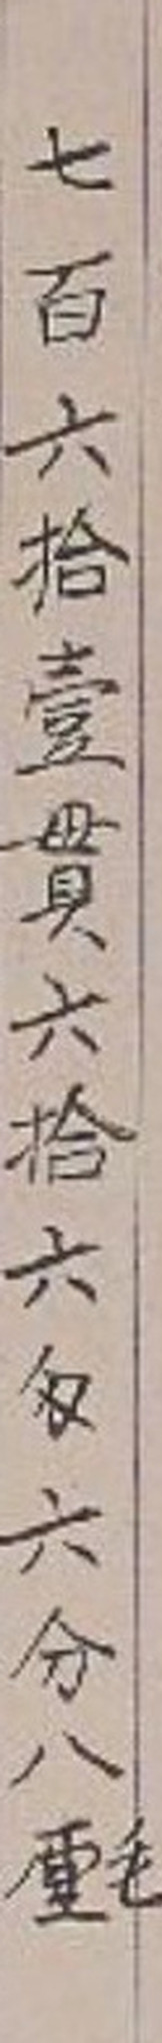七百六拾壹貫六拾六匁六分八厘
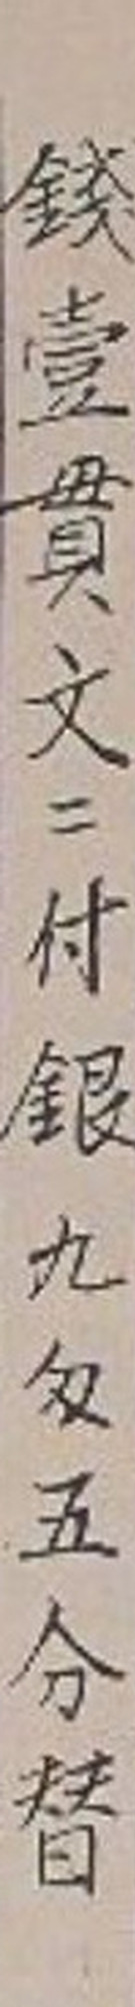錢壹貫文ニ付銀九匁五分替
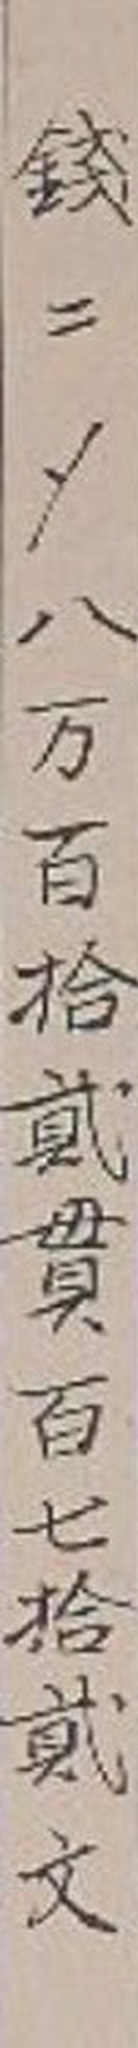錢ニシテ八万百拾貮貫百七拾貮文
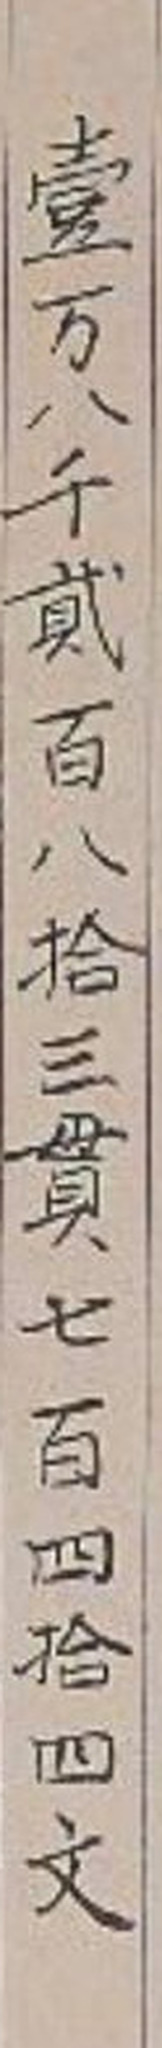壹万八千貮百八拾三貫七百四文
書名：琉球産物於長崎拂立並本手品利潤総帖 弘化四年より酉年迄
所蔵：University of the Ryukyus Library
